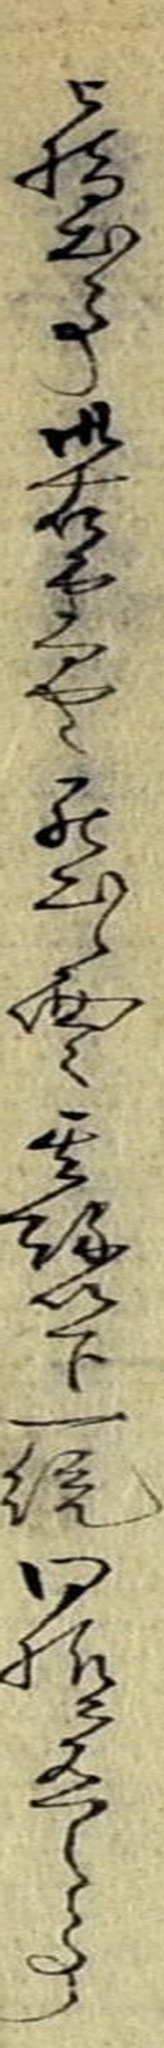被指出候事御右筆部やへ罷出候面々其餘以下一統同様に有之事
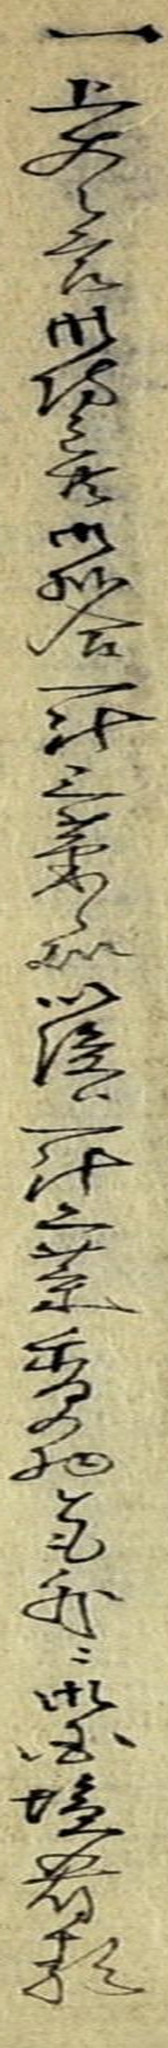一上使之節御坊主共御掛合一汁三菜之処以後は一汁二菜香之物とも外に御国塩肴類
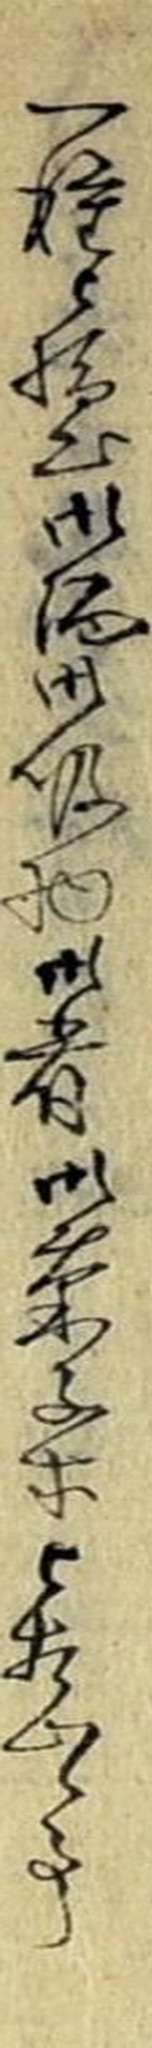一種被差出御酒御吸物御肴御菓子等被相止候事
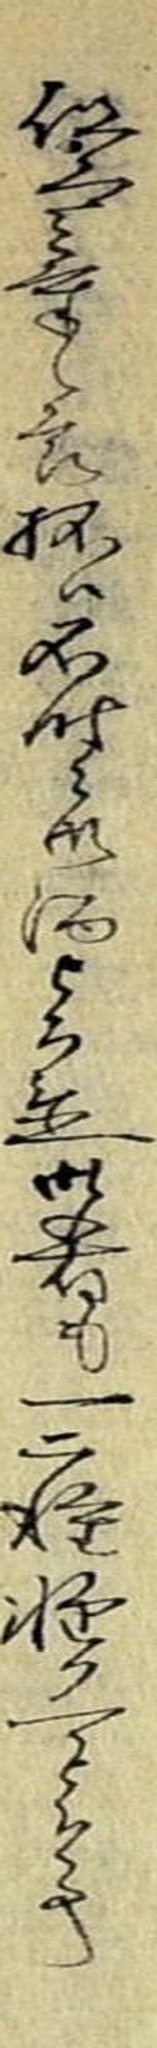但寒気之節抔は不時に御酒被下置御肴も一二種軽ク可被下事
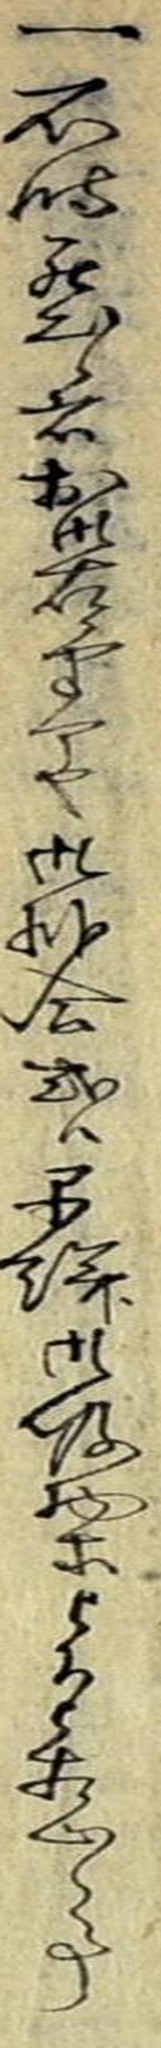一不時罷出候者於御右筆部や御掛合或は草餅御吸物等被下被相止候事
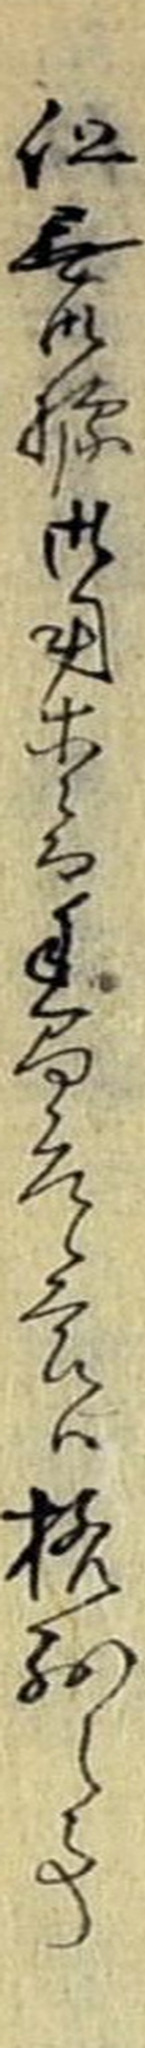但無拠御用等に而手間取候節は格別之事
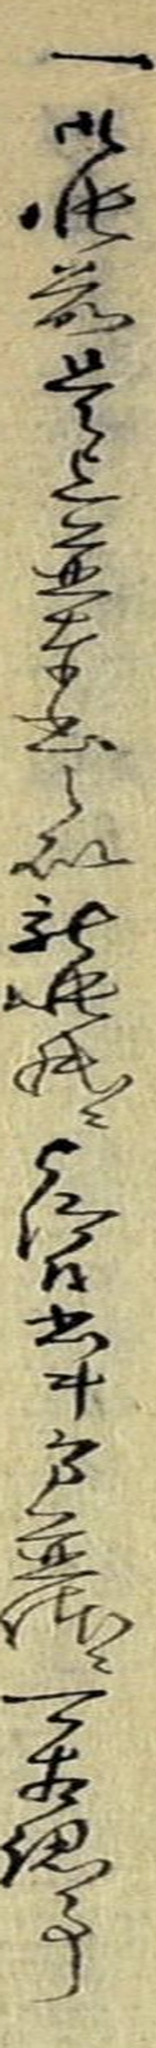一御帳前是迄並奉書之処新帳紙に被仰付書キ方並体に可相認事
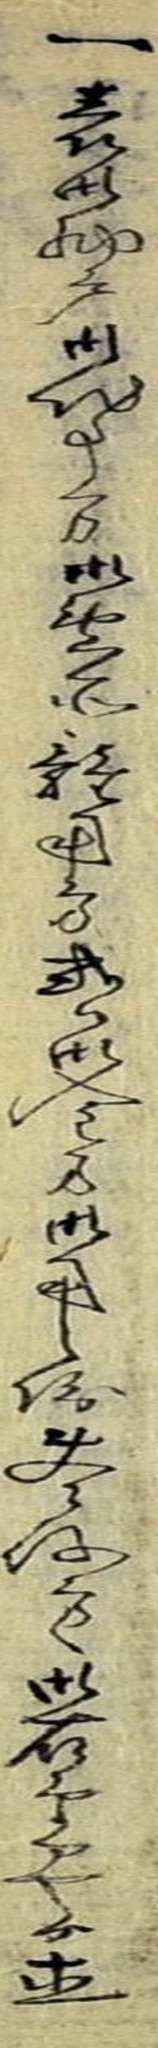一表御納戸御作事方御台所雑用方或は御金方御用之儀夫々役方へ御右筆部屋ゟ直
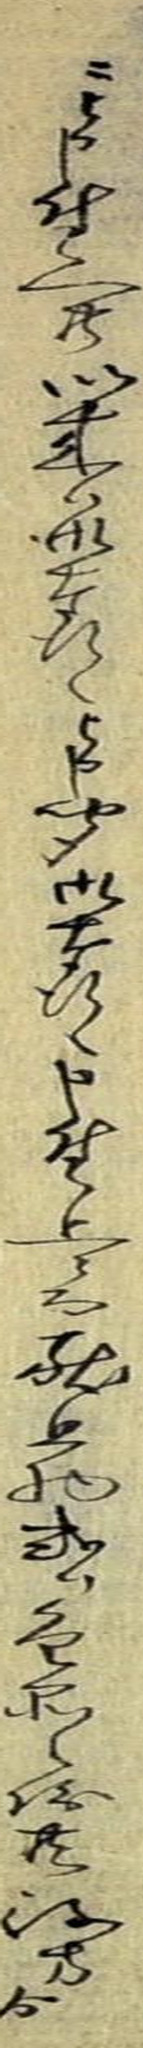々被申付候へ共以來は御奉行へ被申聞御奉行へ申付候上に而献上物或は色品之儀共役方ゟ
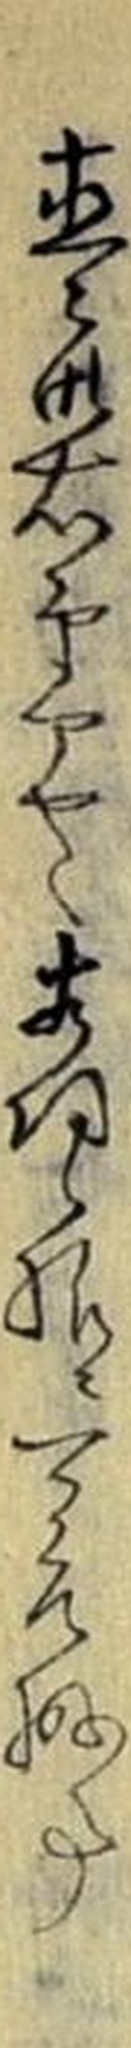直々御右筆部やへ相伺候様に可取扱事
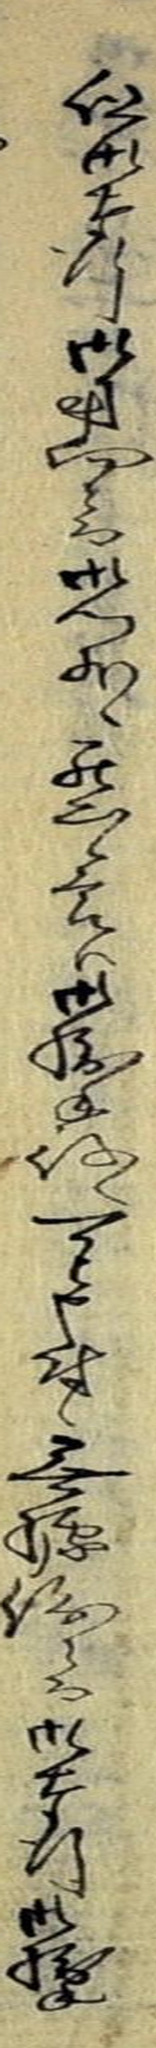但御奉行御用向に而御門外へ罷出候節は御勝手役へ可被申付候無拠儀に而御奉行御勝手
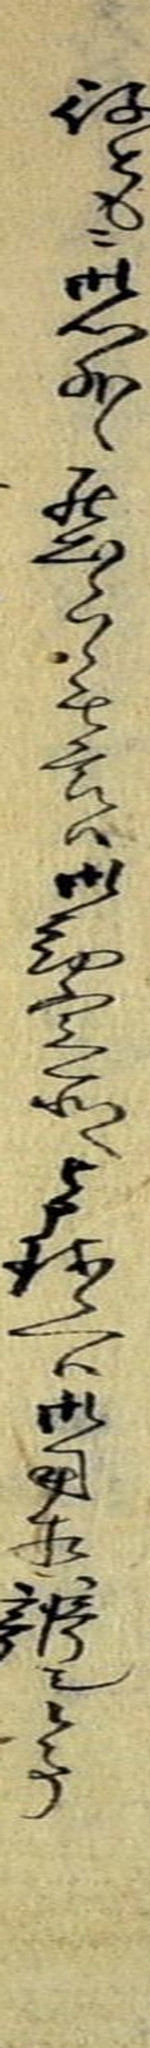役ともに御門外へ罷出候はヽ其節は御勘定所へ被申越候へは御用相弁シ候事
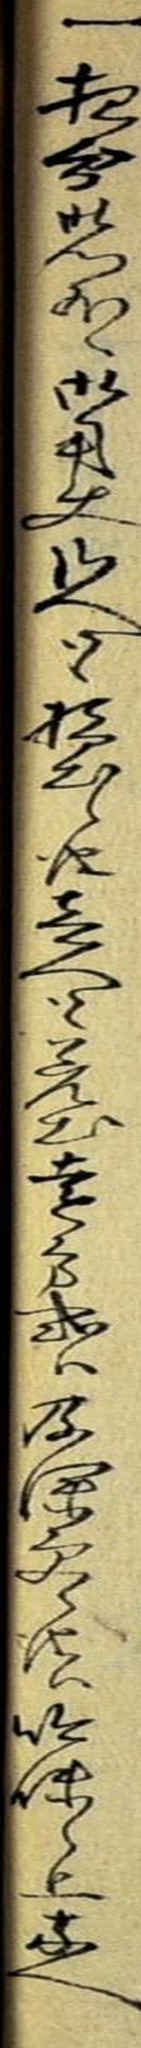一夜分御門外へ御用使弐人つヽ指出候儀壱人つヽ差出遠方或は及深更候儀は吟味之上両人
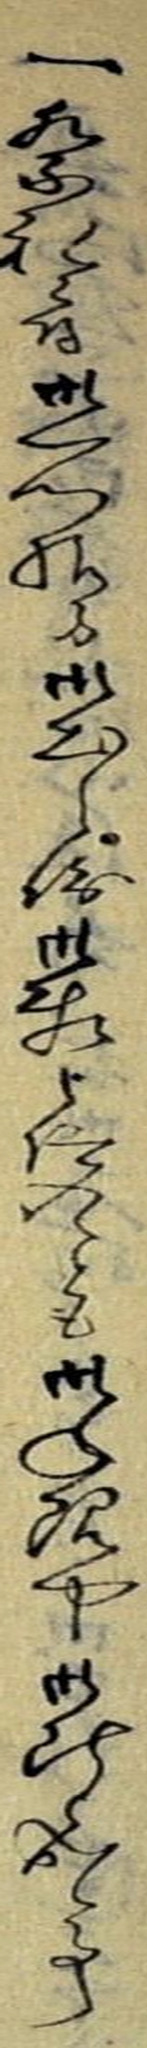一祭礼に付御一門様方御出之儀御頼被仰入候とも御年限中御断被成候事
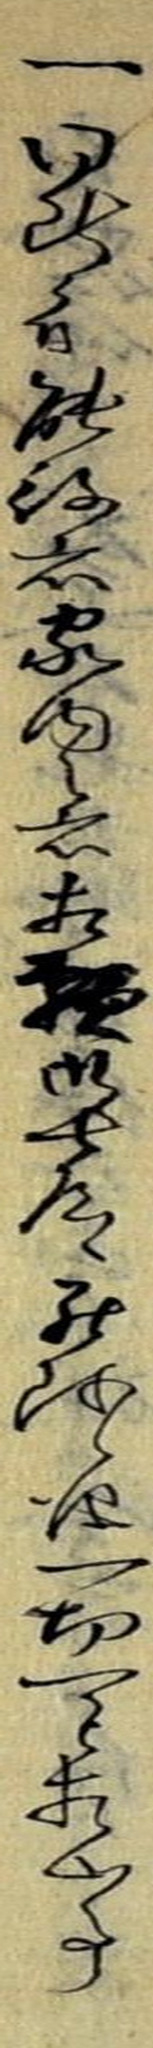一同断に付能役者家内之者相頼御長屋へ罷越儀一切可被相止事
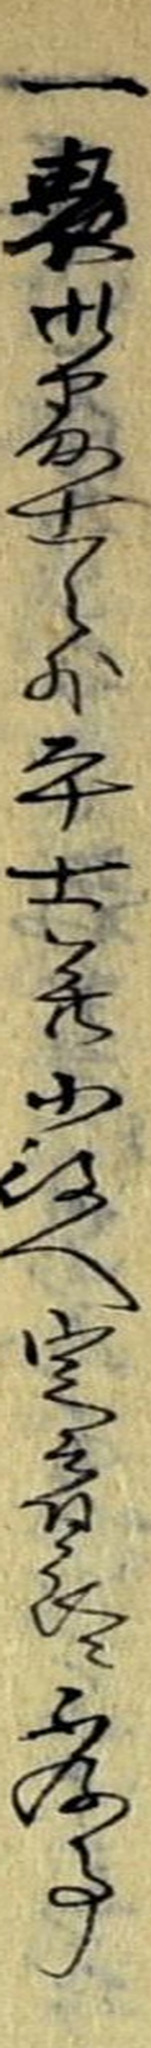一表御番士之外平士并小役人定肩衣に不及事
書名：命令之部 四
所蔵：福井県文書館 Fukui Prefectural Archives
